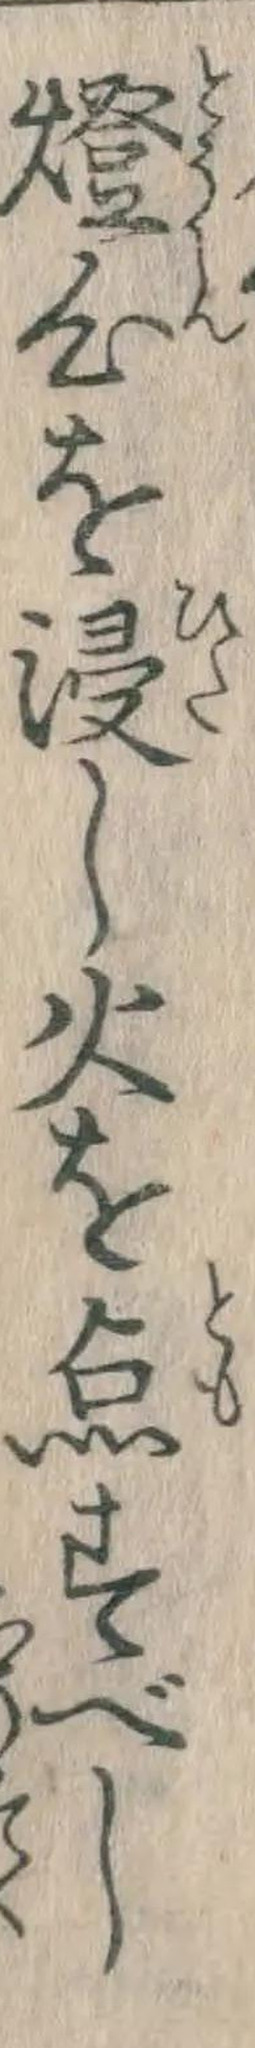燈心を浸し火を点すべし
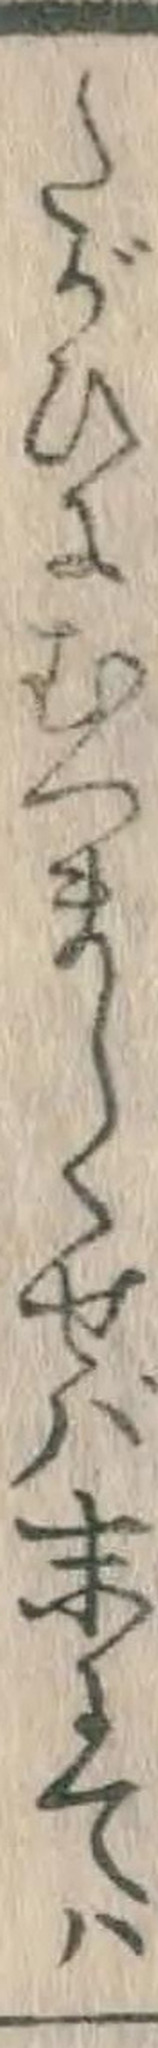たがひにむつましくせば末にては
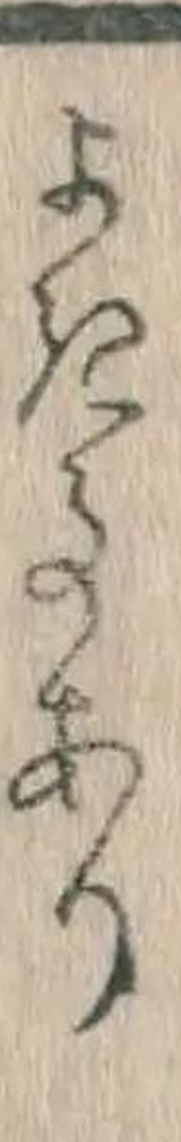よき事あり
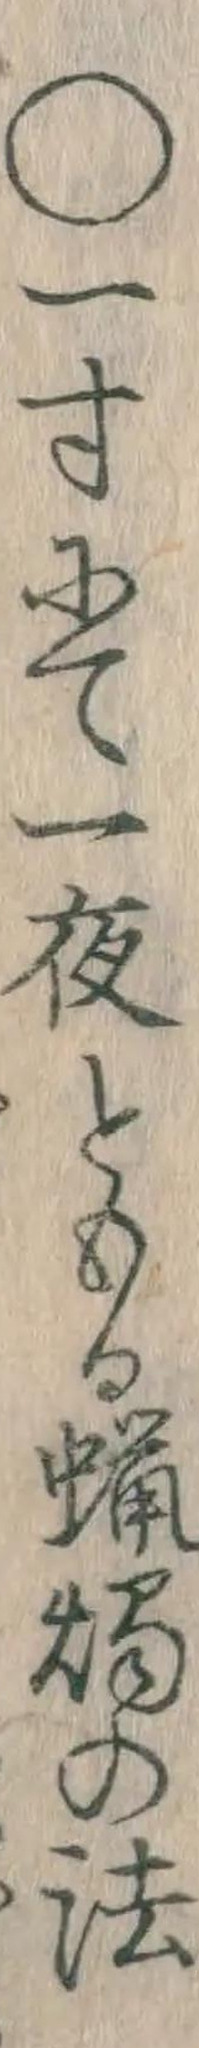○一寸にて一夜ともる蠟燭の法
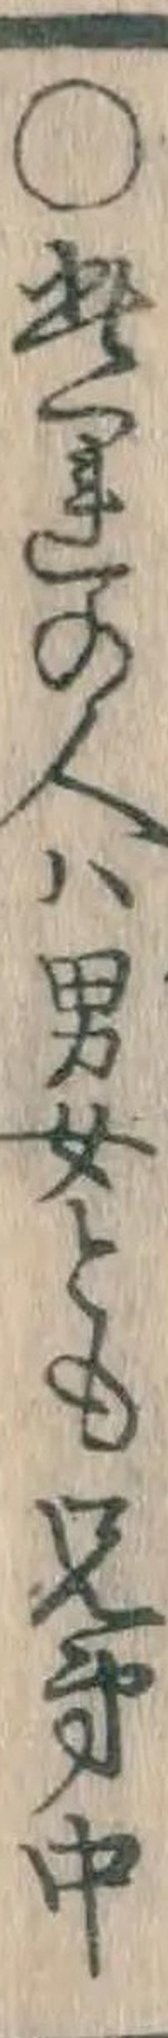○此運の人は男女とも兄弟中

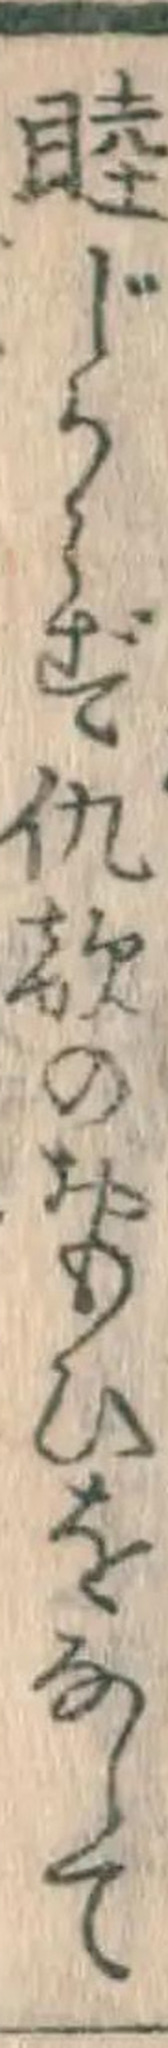睦じからず仇敵のおもひをなして
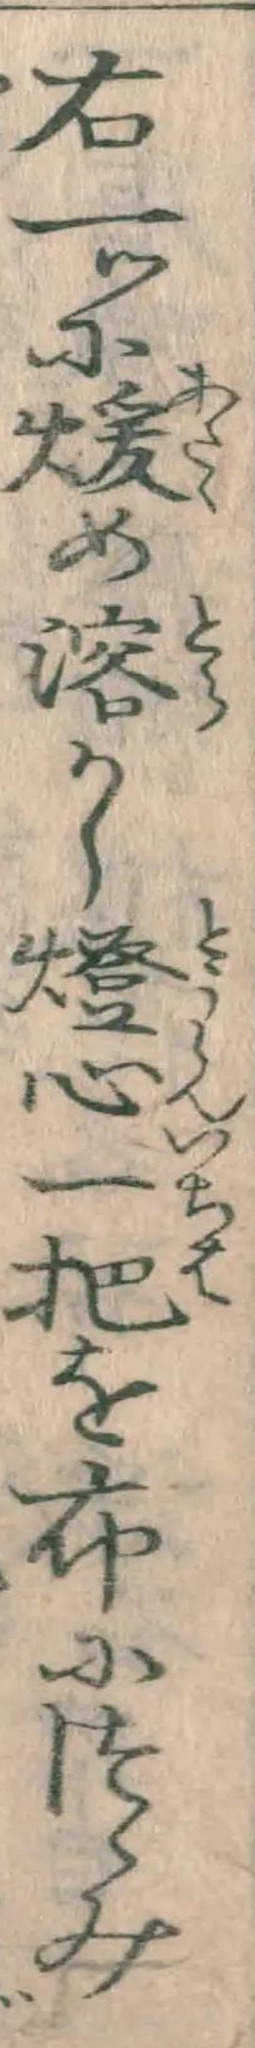右一ッに煖め溶かし燈心一把を布につゝみ
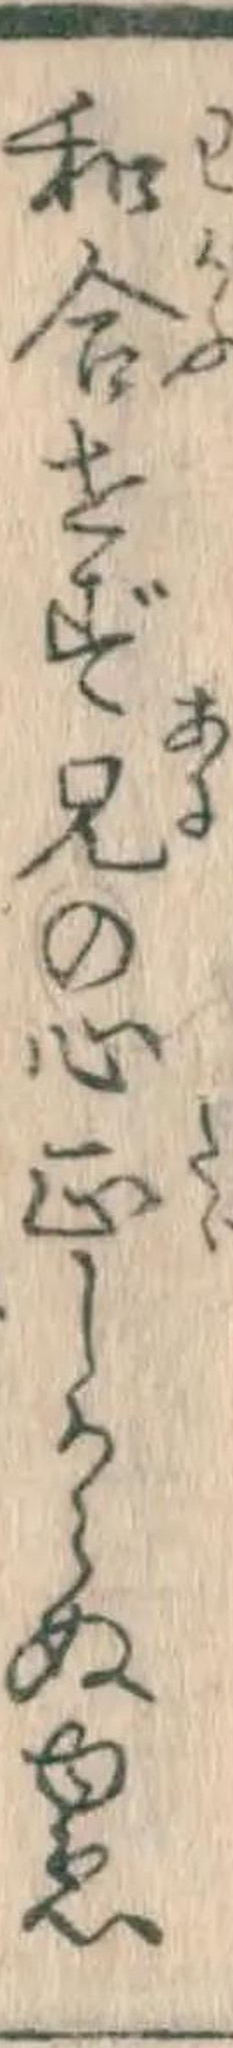和合せず兄の心正しからぬゆゑ
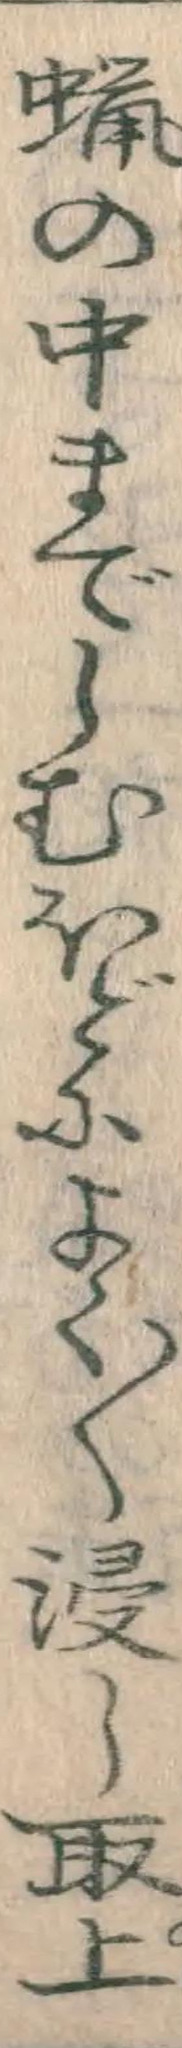蠟の中までしむほどによく〳〵浸し取上
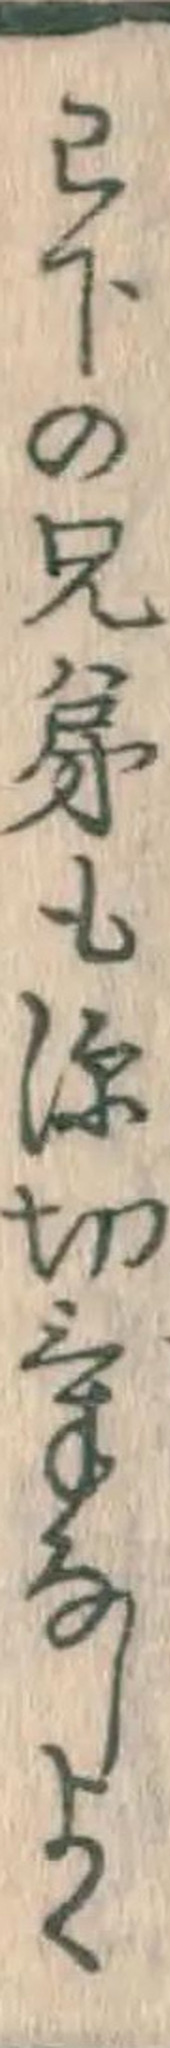已下の兄弟も深切気なしよく
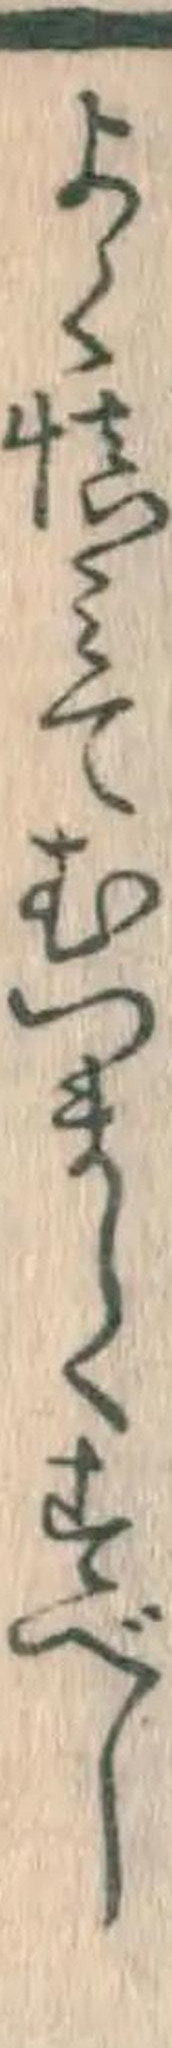よく慎みてむつましくすべし
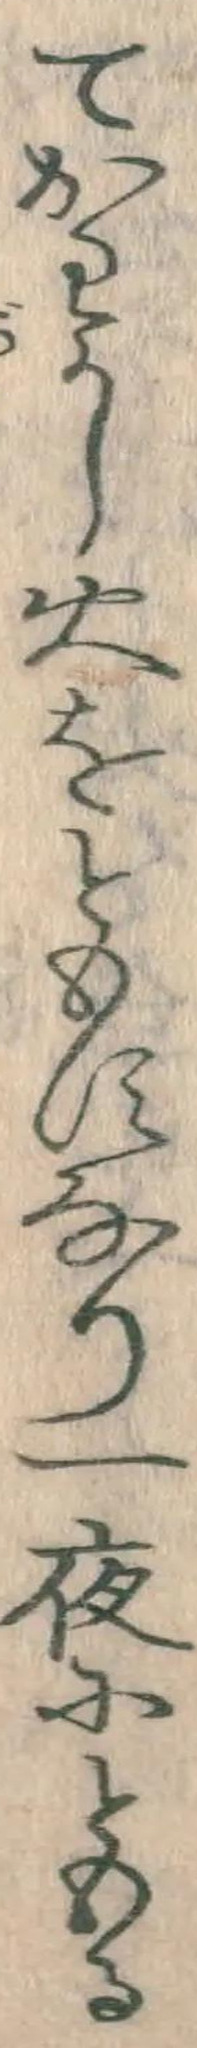てかわかし火をともすなり一夜にともる
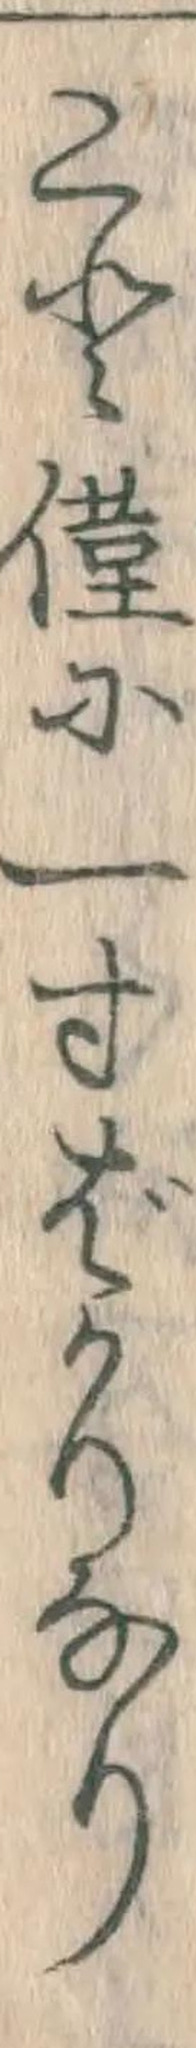こと僅に一寸ばかりなり
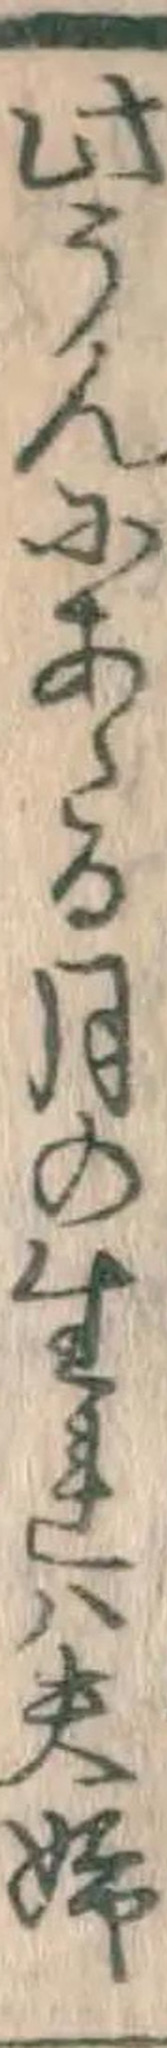此うんにあたる月の生れは夫婦
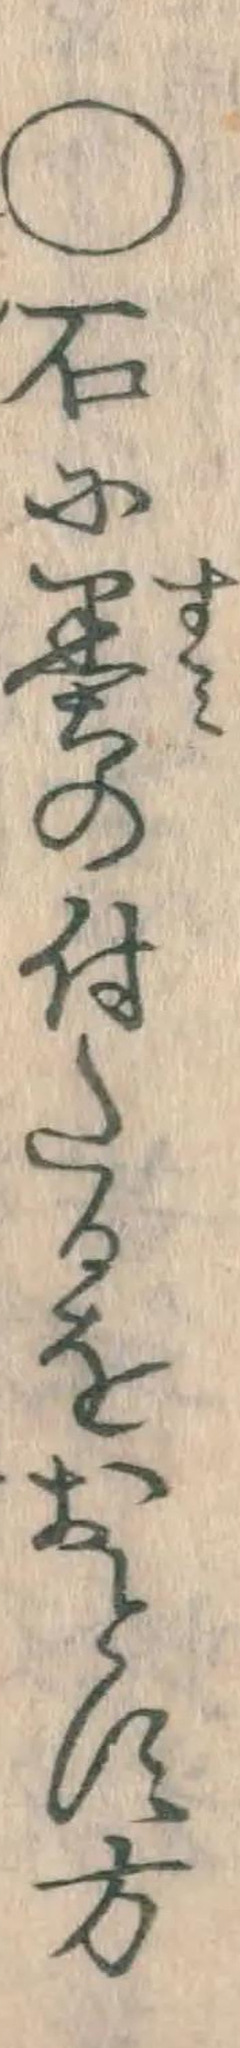○石に墨の付たるをおとす方
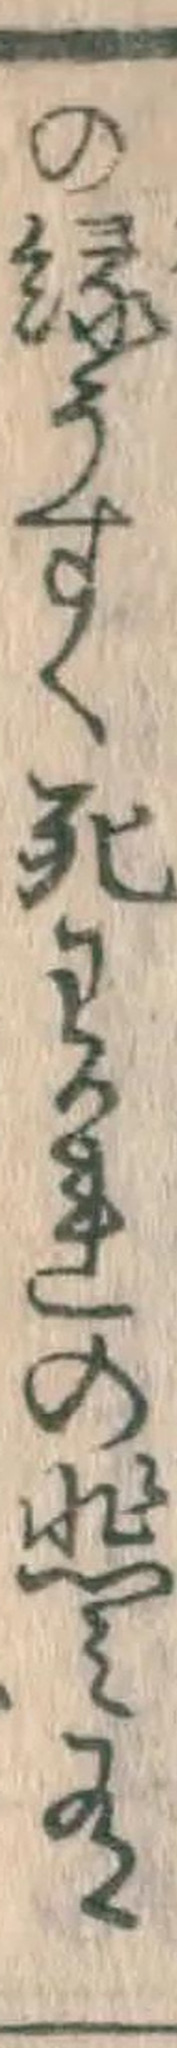の縁うすく死わかれの悲み有
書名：広益秘事大全 3巻. [2]
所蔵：国立国会図書館 National Diet Library, JAPAN
